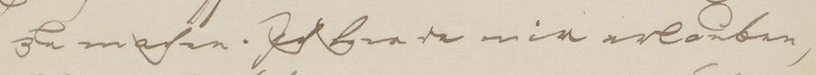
zu machen. Ich werde mir erlauben,
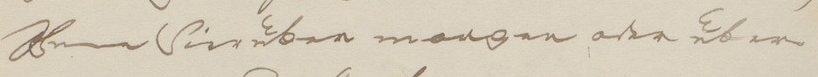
Ihnen hierüber morgen oder über-
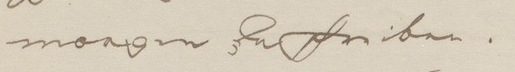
morgen zu schreiben.
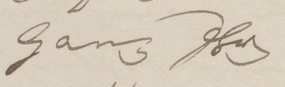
Ganz Ihr
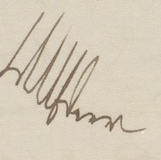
Escher
